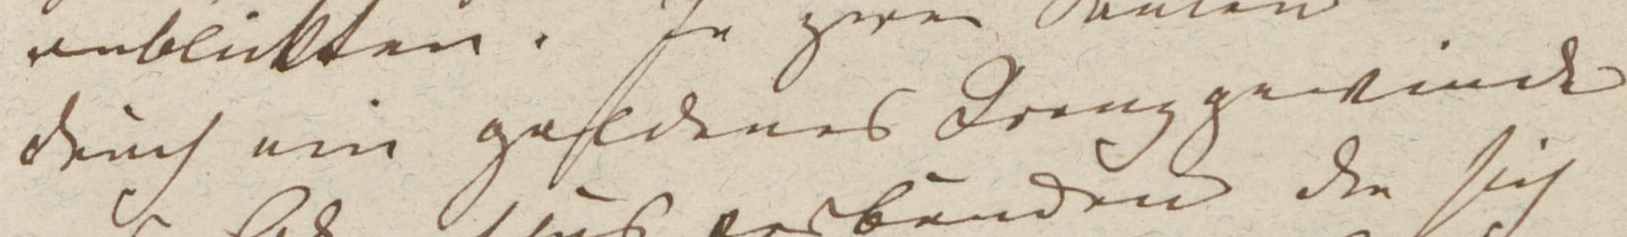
durch ein goldenes Krzgewinde
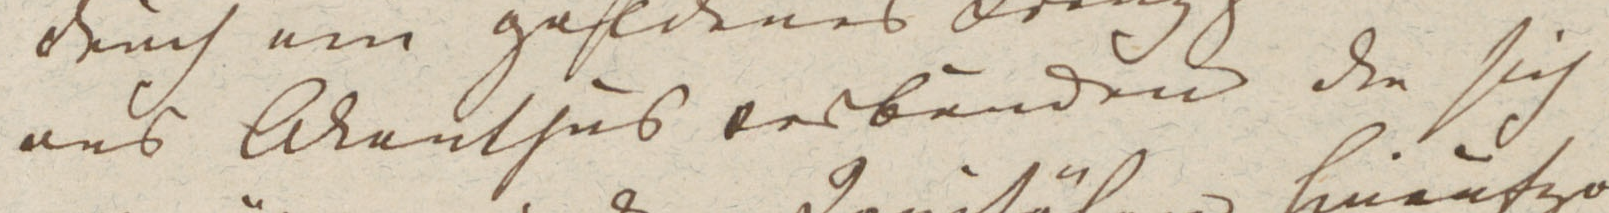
aus Akanthus verbunden die sich
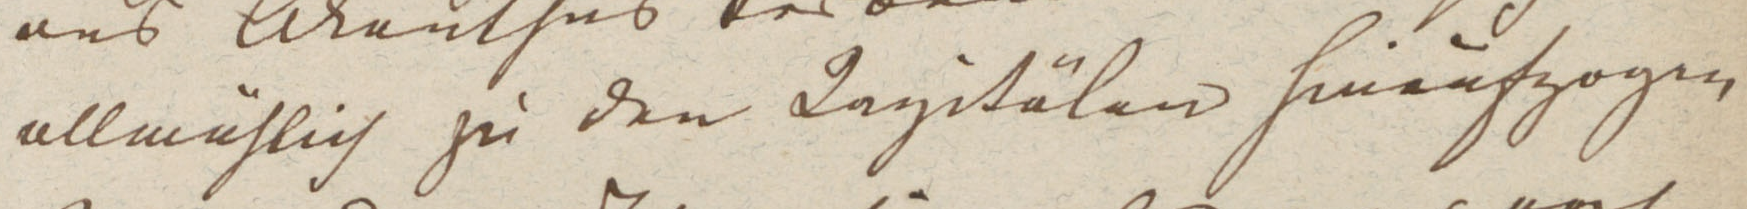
allmählich zu den Kapitälen hinaufzogen
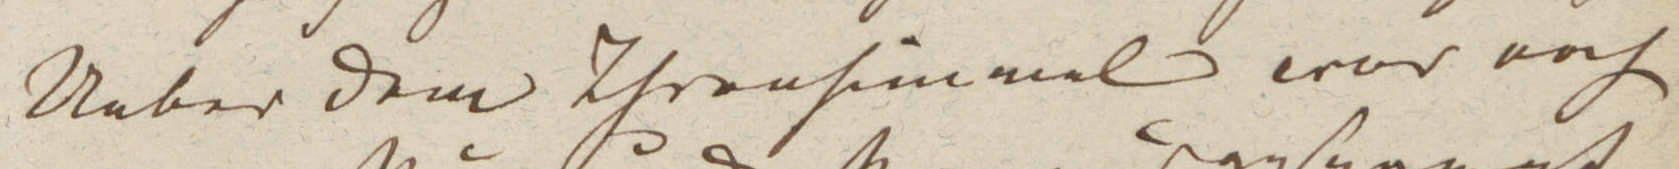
Ueber dem Thronhimmel war noch
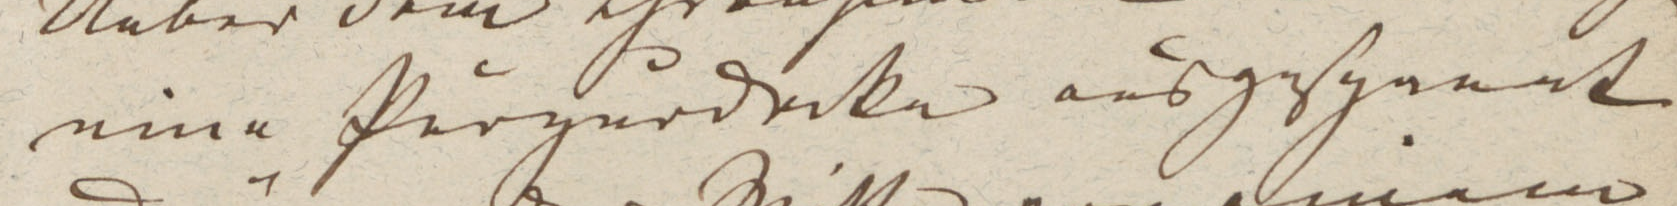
eine Purpurdecke ausgespannt
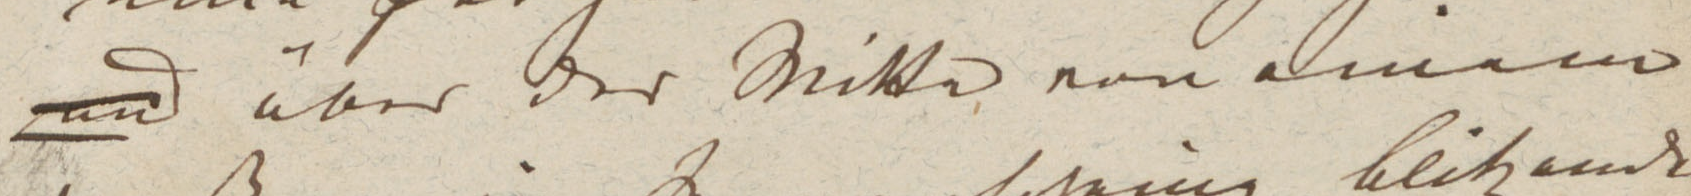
und über der Mitte von einem
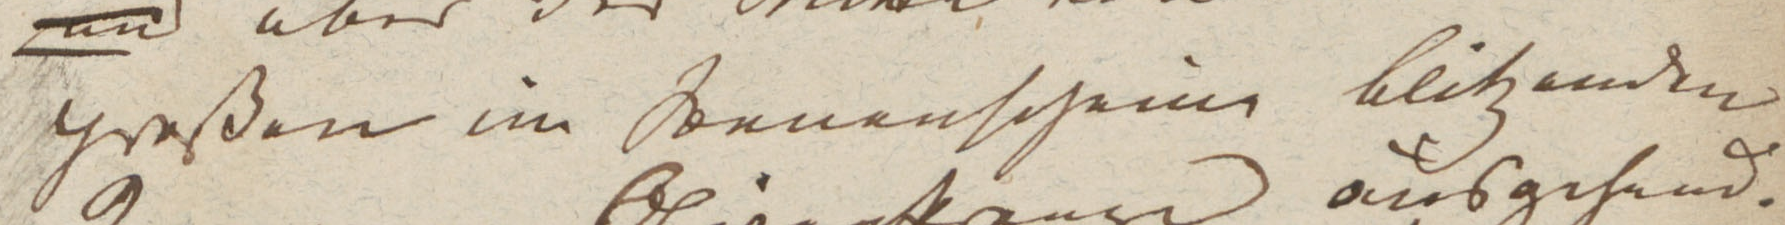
grossen im Sonnenscheine blitzenden
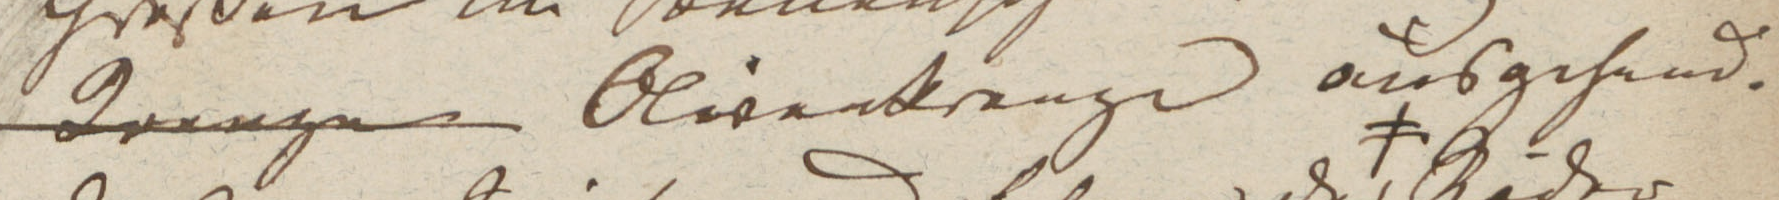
Kranze Olivenkranze ausgehend.
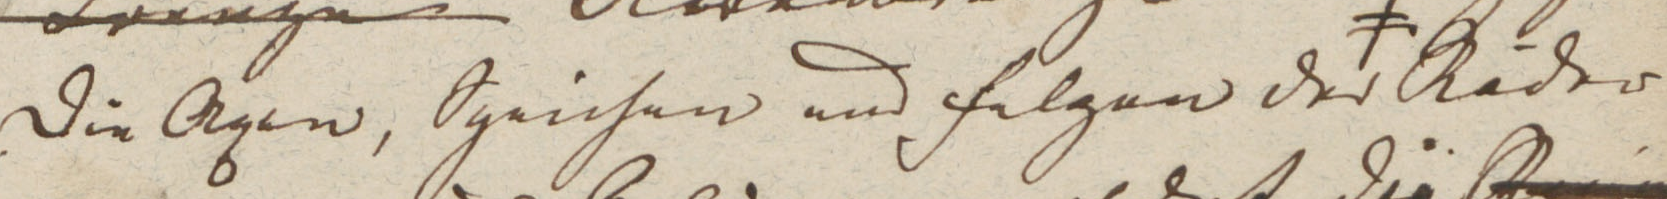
Die Axen, Speichen und Felgen der % Räder
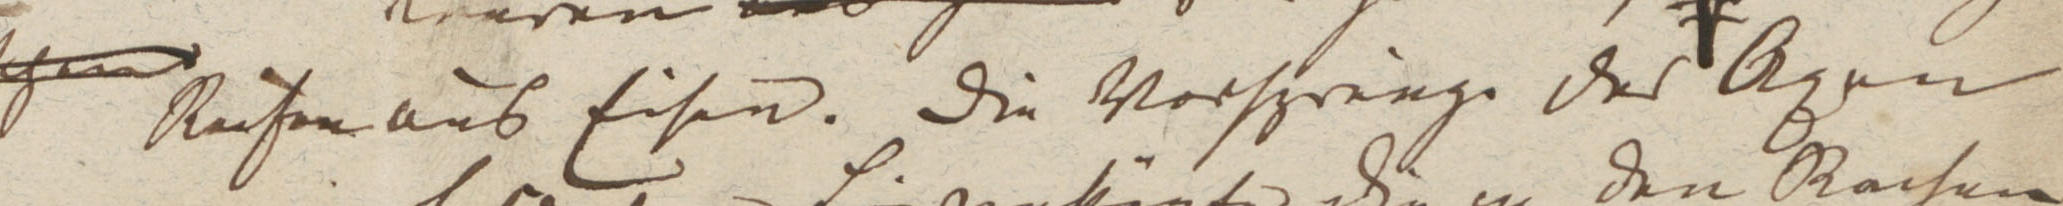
Reifen aus Eisen. Die Vorsprünge der % Axen
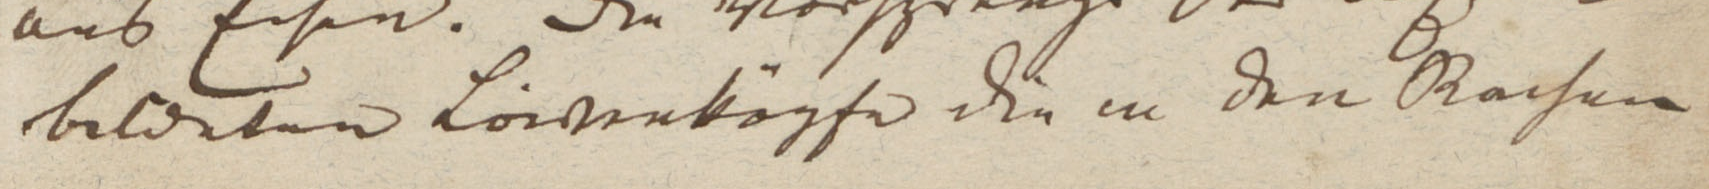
bildeten Löwenköpfe die in den Rachen
